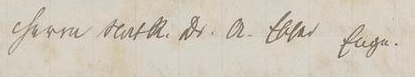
Herrn NatR. Dr. A. Escher Enge.
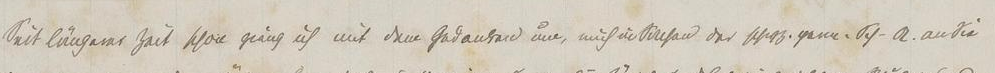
Seit längerer Zeit schon gieng ich mit dem Gedanken um, mich in Sachen der schwz. perm. Sch.A. an Sie
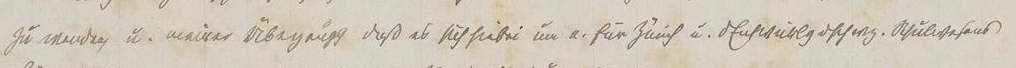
zu wenden u. meiner Überzeugg daß es sich hiebei um e. für Zürich u. d Entwicklg d schwz. Schulwesens
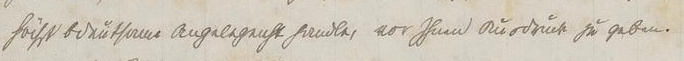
höchst bdeutsame Angelegenht handle, vor Ihnen Ausdruck zu geben.
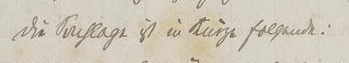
Die Sachlage ist in Kürze folgende:
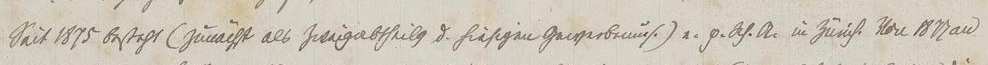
Seit 1875 besteht (zunächst als Zweigabtheilg d. hiesigen Gewerbemus.) e. p. Sch.A. in Zürich. Von 1877 an
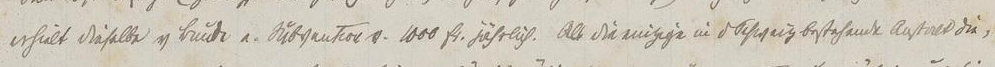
erhielt dieselbe vom Bunde e. Subvention v. 1000 fr. jährlich. Als die einzige in d Schweiz bestehende Anstalt die-
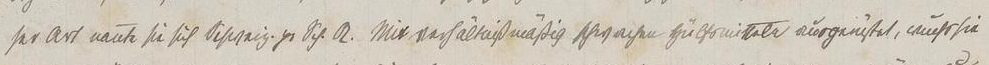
ser Art nannte sie sich Schweiz. p. Sch.A. Mit verhältnißmäßig schwachen Hülfsmitteln ausgerüstet, wuchs sie
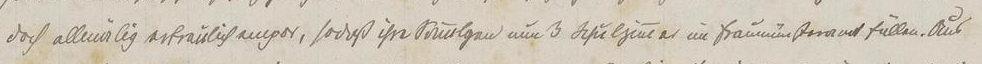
doch allmälig erfreulich empor, sodaß ihre Sammlgen nun 3 Schulzimmer im Fraumünsteramt füllen. Aus
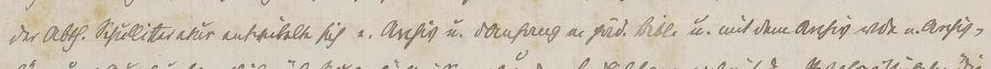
der Abth. Schullitteratur entwikelte sich e. Archiv u. d Anfang e. päd. Bibl. u. mit dem Archiv wde e. Archiv-
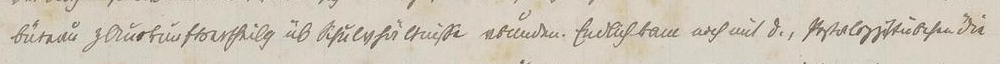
büreau z Auskunftsertheilg üb Schulvhältnisse vbunden. Endlich kam noch mit d. «Pestalozzistübchen» die
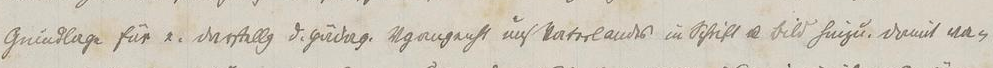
Grundlage für e. Darstellg d. pädag. Vgangenht uns Vaterlandes in Schrift & Bild hinzu. Damit wa-
